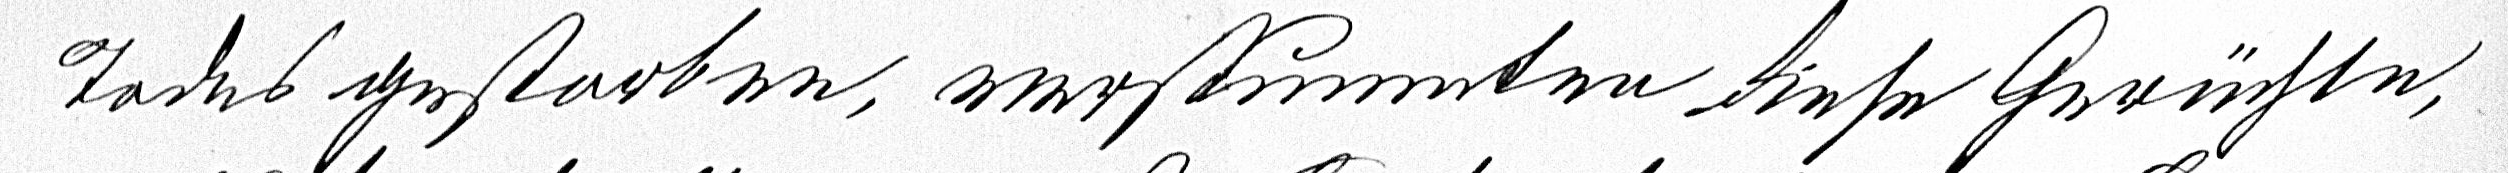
Todes gestorben, verstumxxten diese Gerüchte,
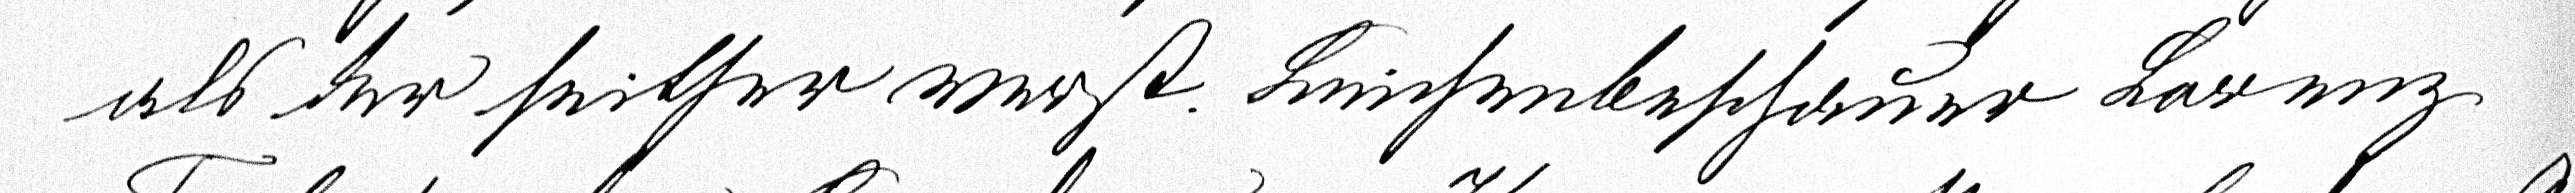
als der seither verst. Leichenbeschauer Lorenz
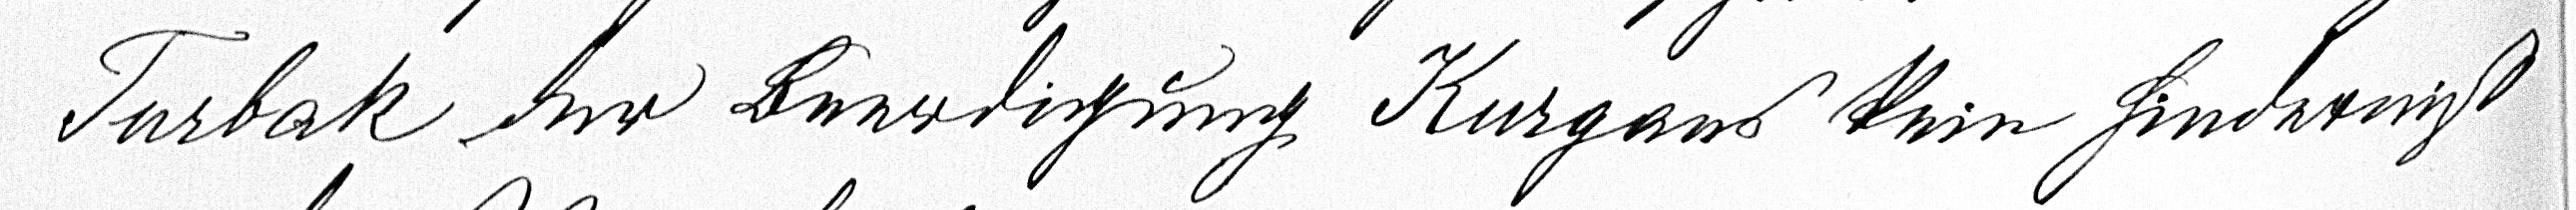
Turbak der Beerdigung Kurgans kein Hinderniß
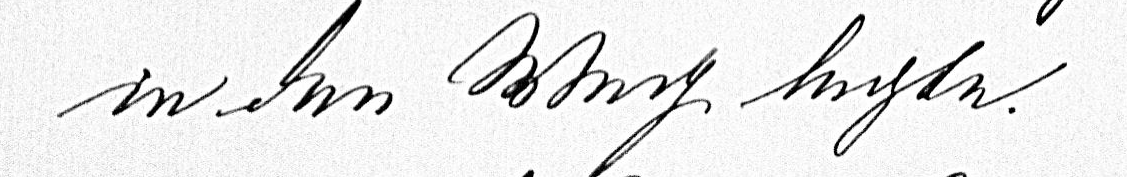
in den Weg legte.
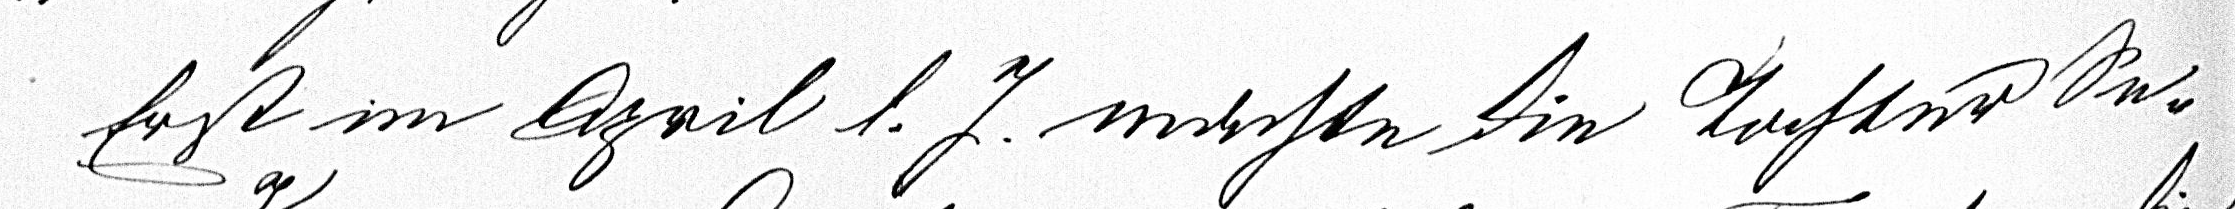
Erst im April l. J. machte die Tochter Se¬
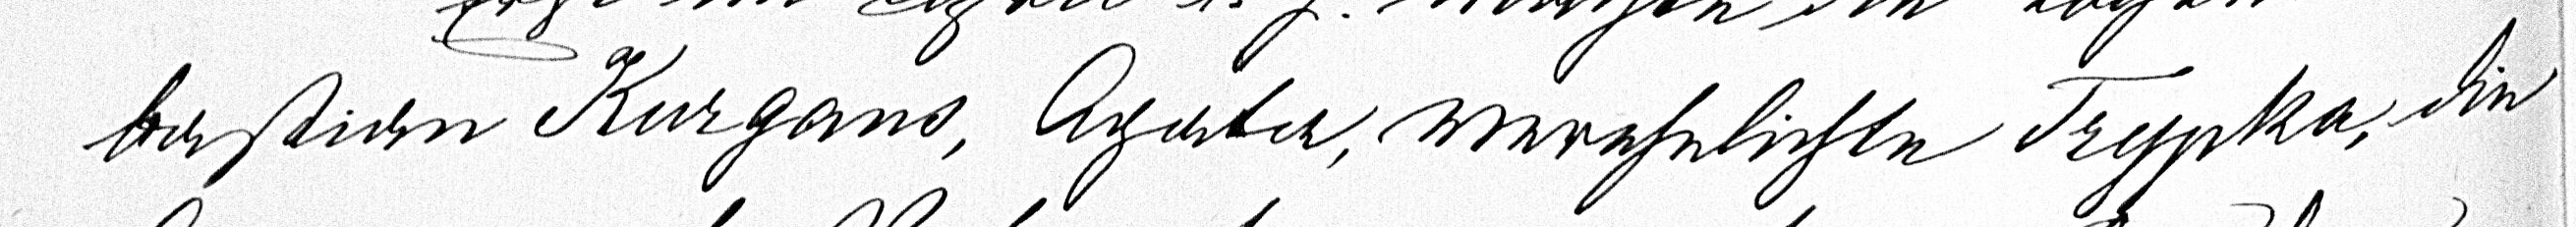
bastian Kurgans, Agata, verehelichte Trypka, die
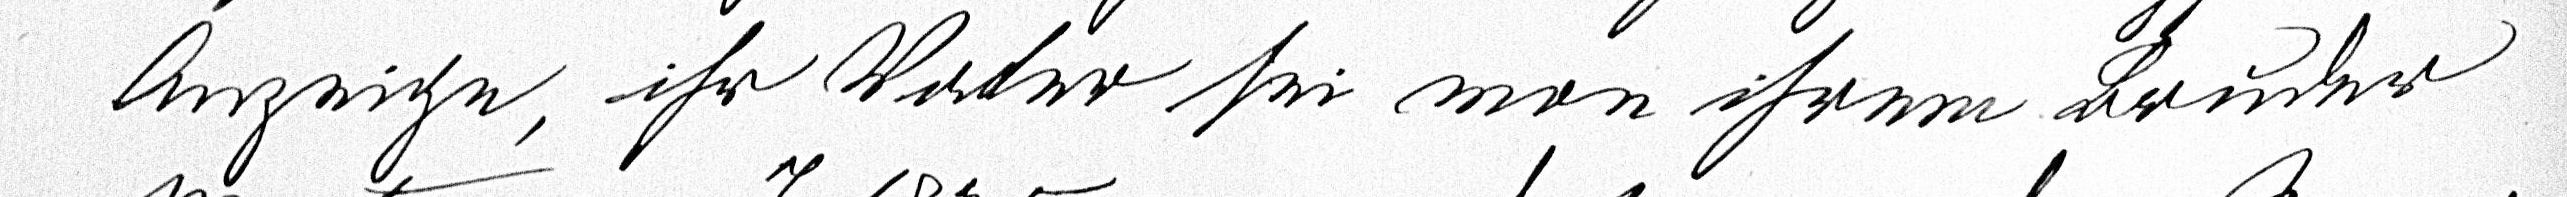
Anzeige, ihr Vater sei von ihrem Bruder
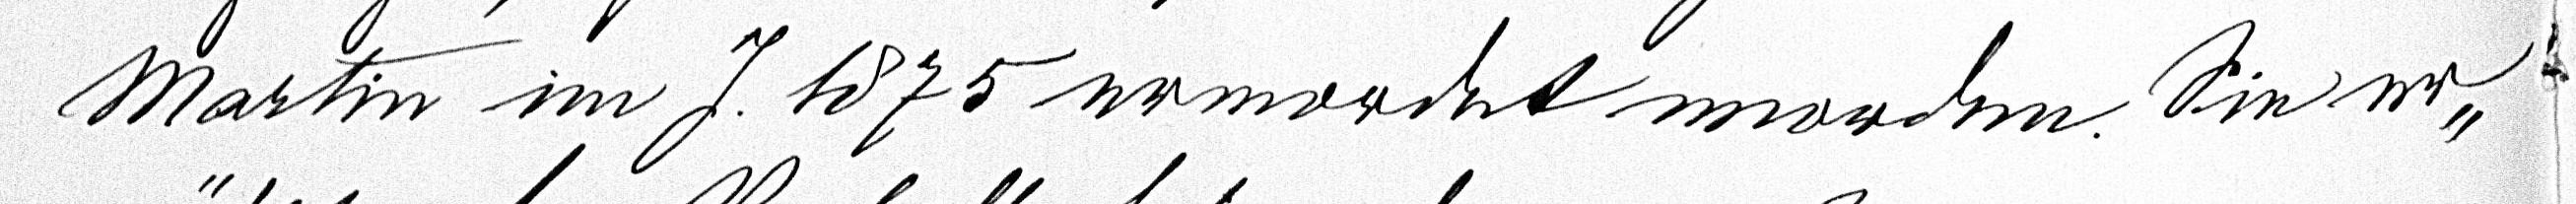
Martin im J. 1875 ermordet morden. Sie er¬
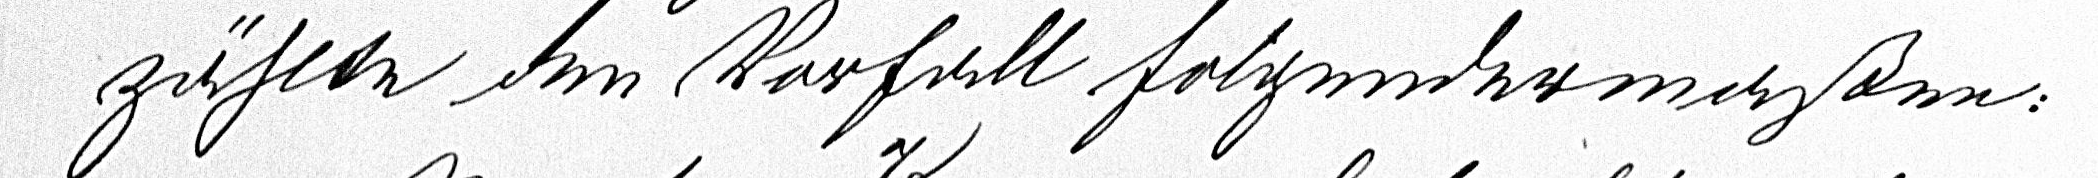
zählte den Vorfall folgendermaßen:
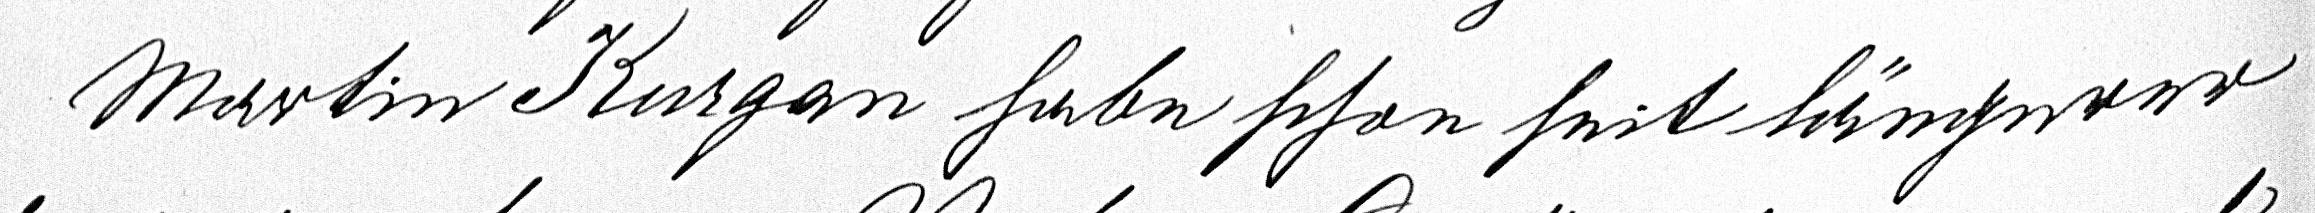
Martin Kurgan habe schon seit längerer
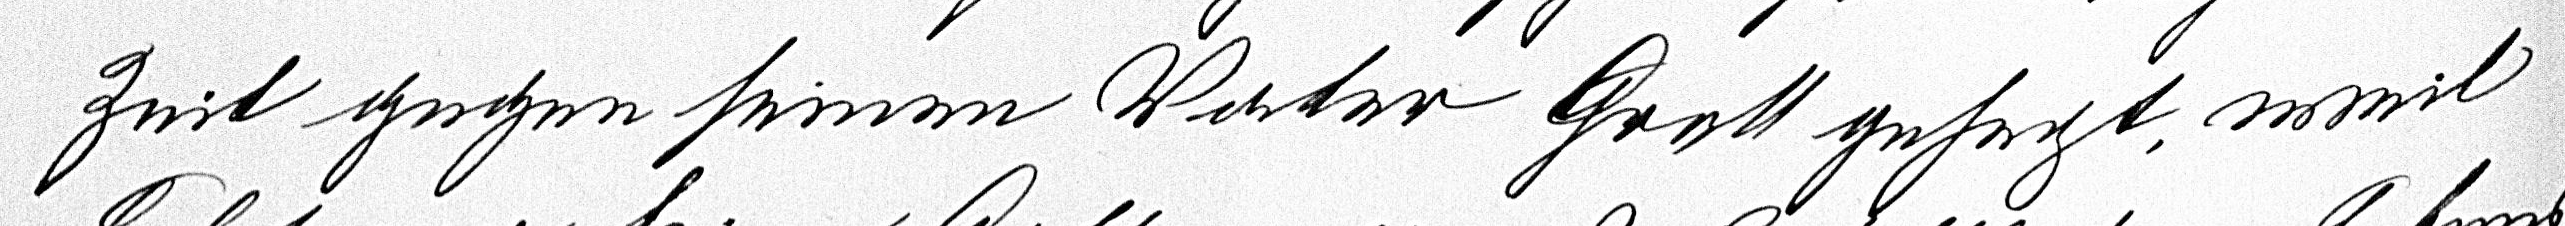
Zeit gegen seinen Vater Grell gehegt, weil
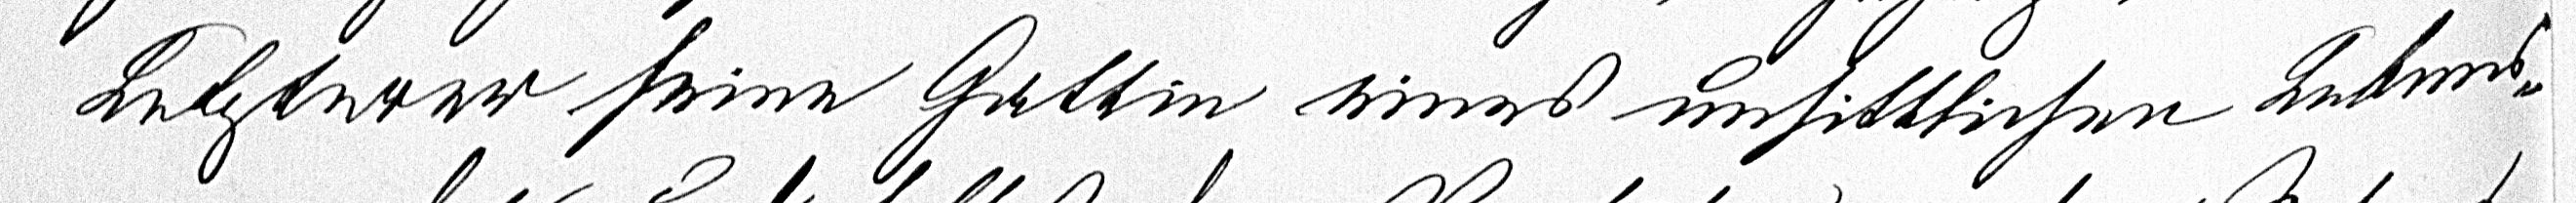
Letzterer seine Gattin eines unsittlichen Lebens¬
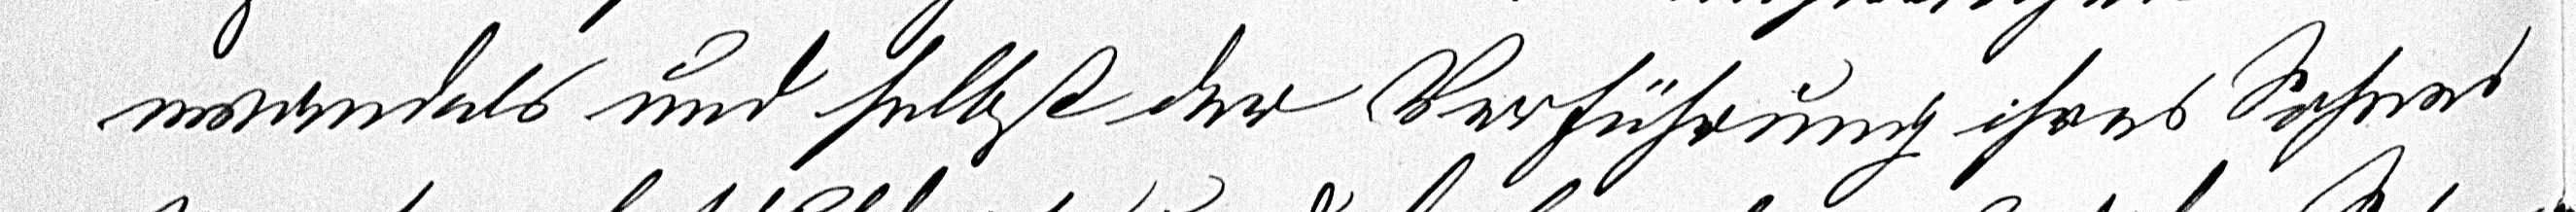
wandels und selbst der Verführung ihres Sachens
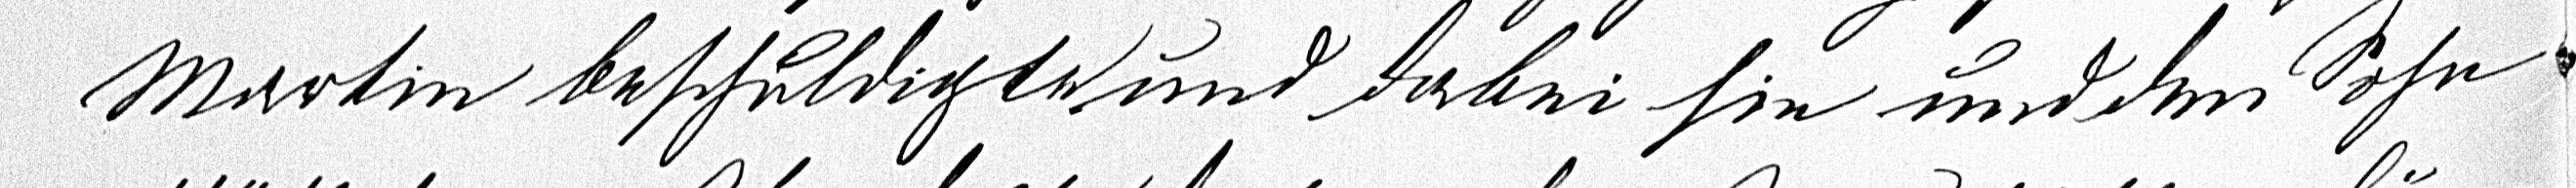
Martin beschuldigte und dabei sie und den Sohn
